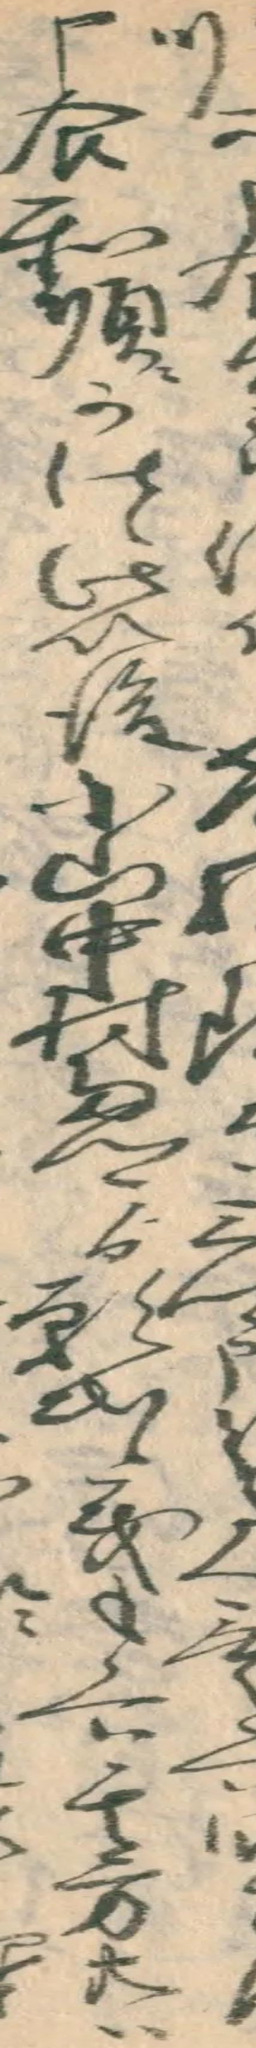申合和順ニ可仕候此以後小山中村両郷ゟ願出候義も候へハ其方共ハ
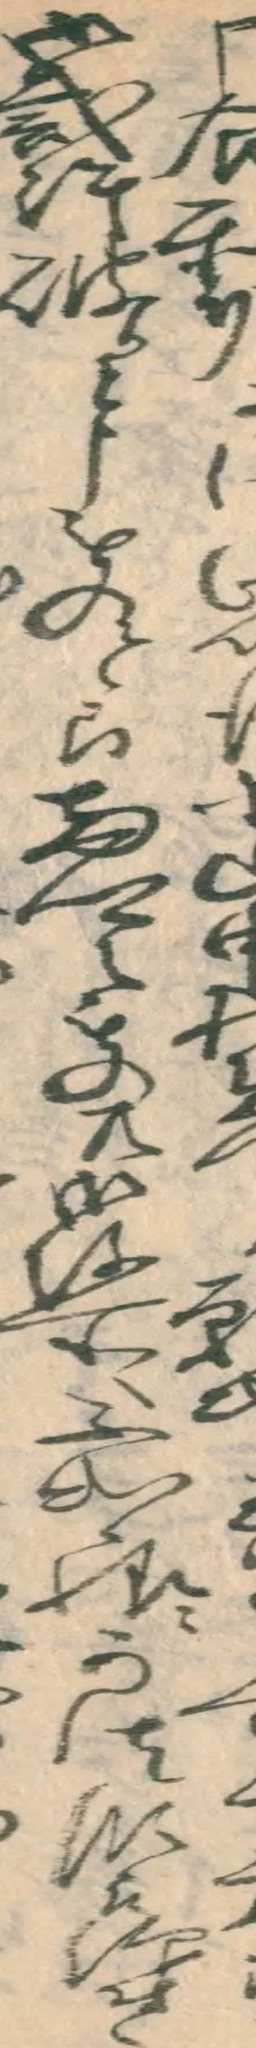御裁許破りと申ものニ候間両郷之もの共御役所へ不出候様ニ可仕候段被仰付候
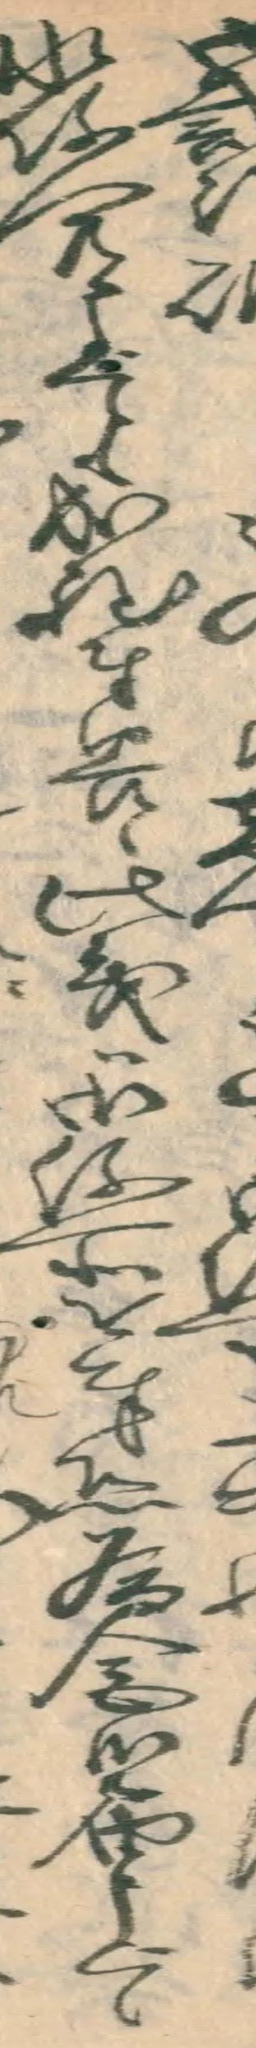御役人共申上候も成程奉畏候此義ハ御役所を奉恐為念御届申上候
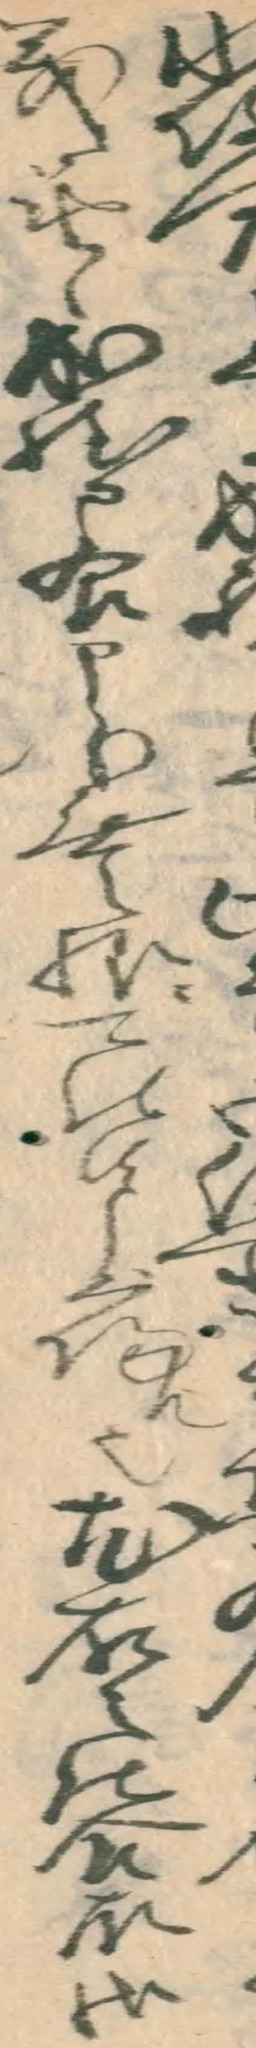義ニ御座候成程申合申分無之様ニ可仕由申上帰ル也尤右之仕合故御
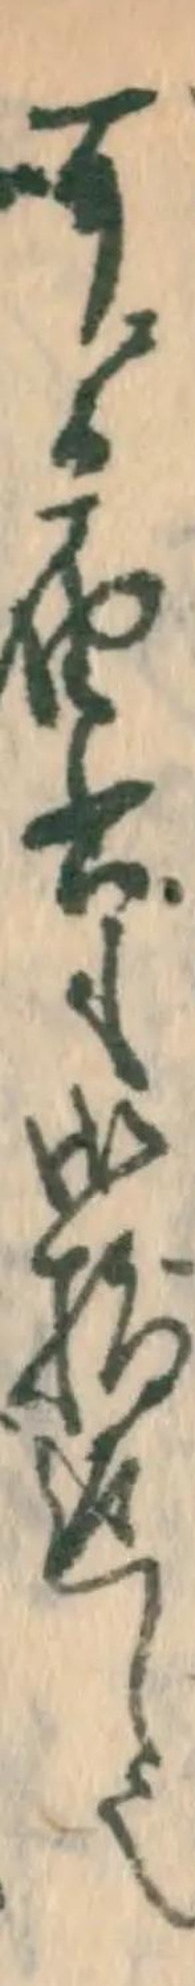呵ニ而届書も御指返候也
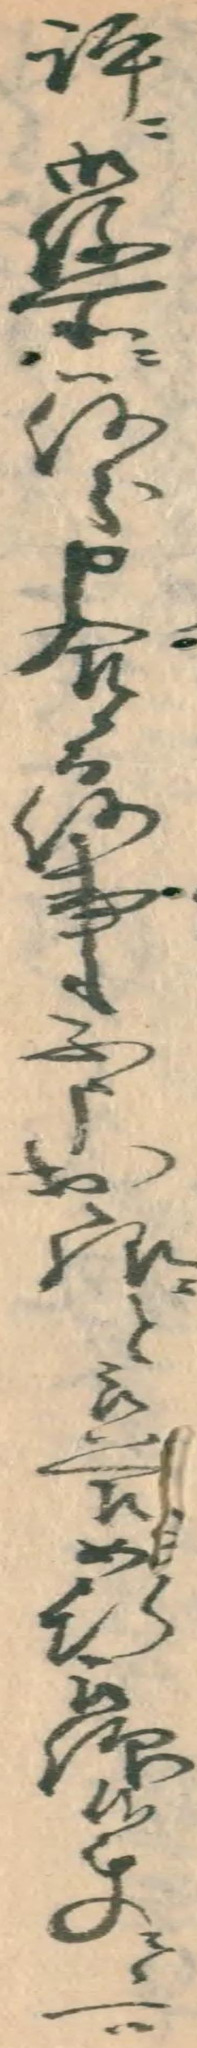評ニ御役所ニハ何分申合候而何事も不申出候様ニと被思召如斯被仰候ものニ候ヘハ
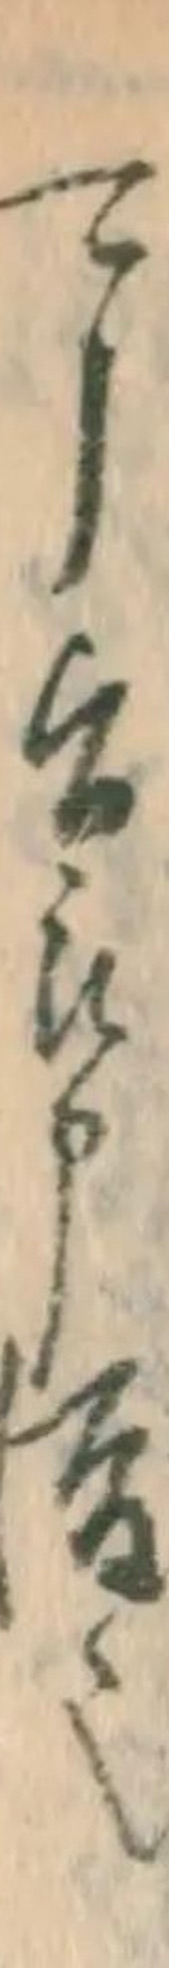可申旨被申渡也
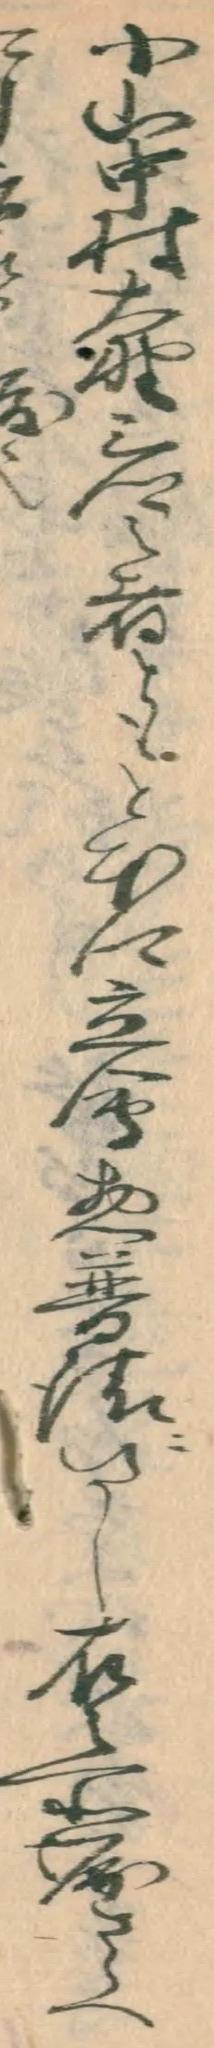小山中村大野三郷之者ともと本郷立会惣普請にいたし右之所堀さらへ
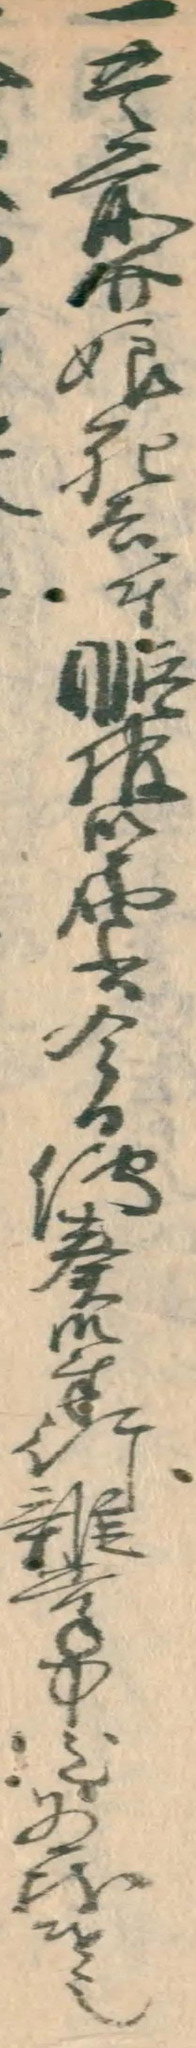一豊前介娘死去ニ付暇服御届書今日伝奏御奉行雑掌中迄為持遣也
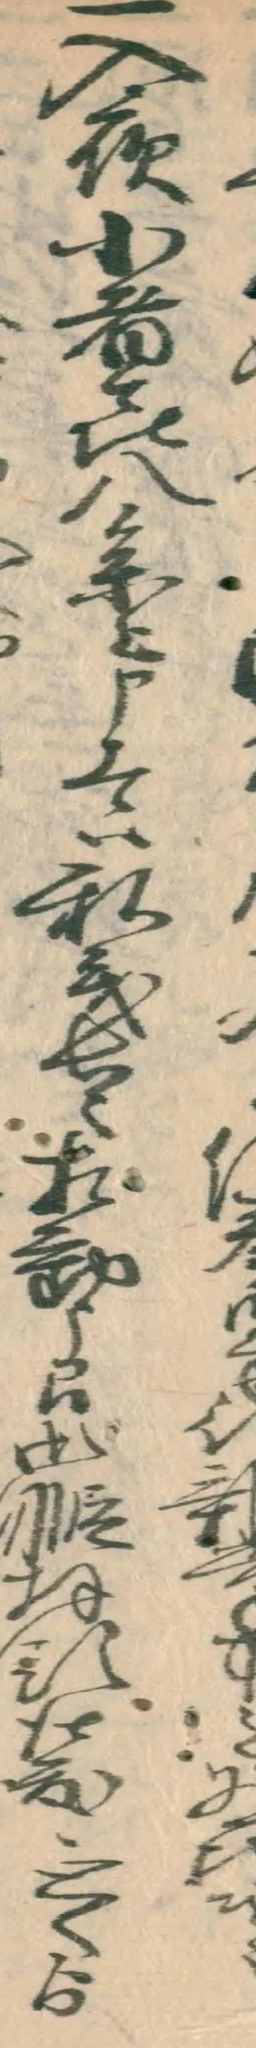一入夜小者喜八参上申上候ハ私義長々相勤申間御暇拝領仕度候とくゟ
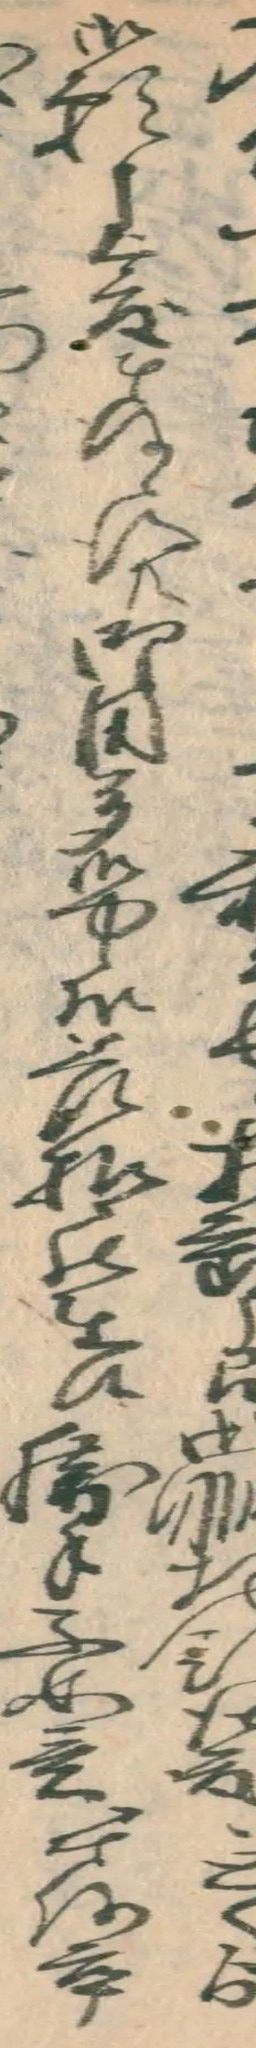御願申上度奉存候得共御用多御中故差扣罷在候勝手不如意ニ付何卒
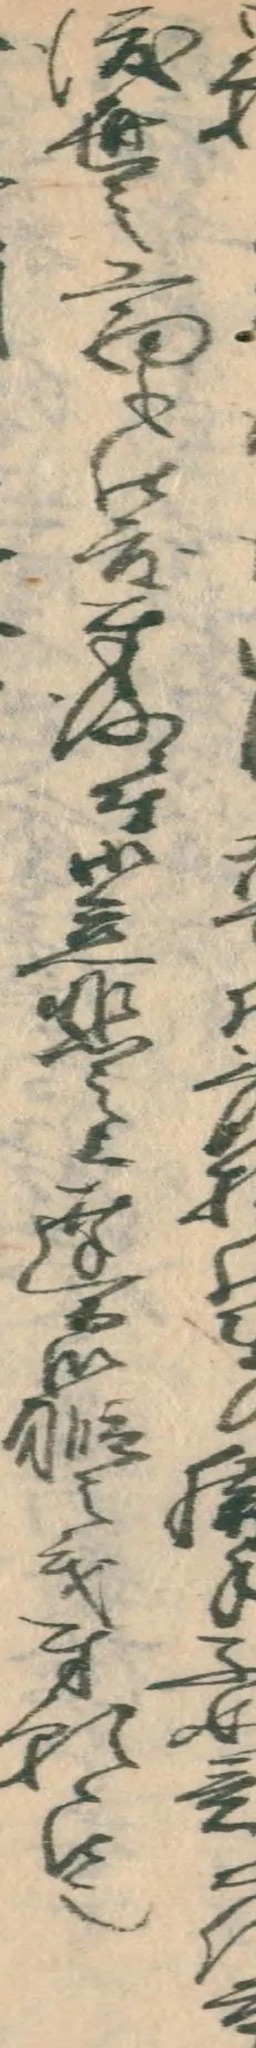渡世之工面も仕度奉存ニ付御慈悲之上達而御暇之義奉願候由也
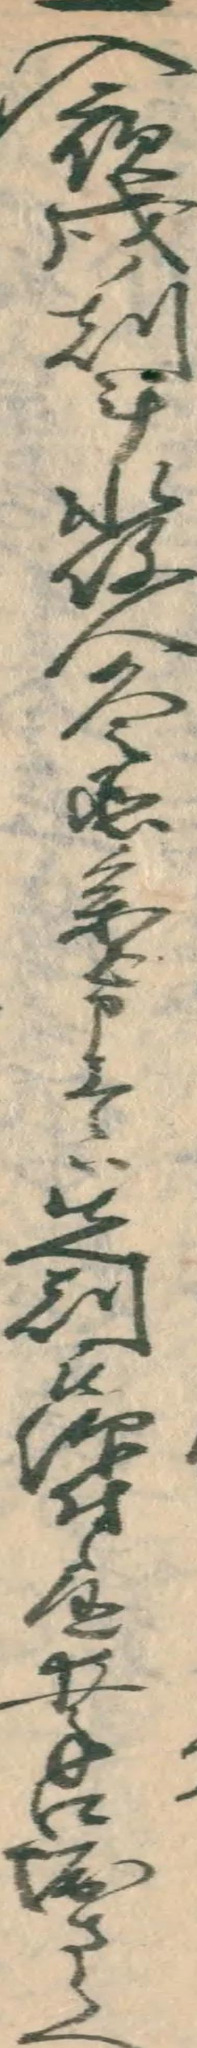一入夜戌ノ刻計水役人久之丞参上申上候ハ先刻被仰付候通井手口堀さらへ
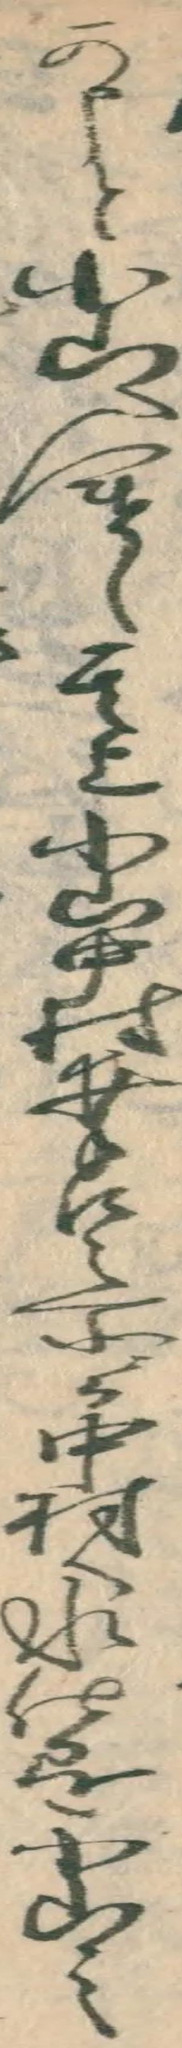可申と小山へ人遣し其上小山中村井手口之所ニ而中村へ水仕懸小山之
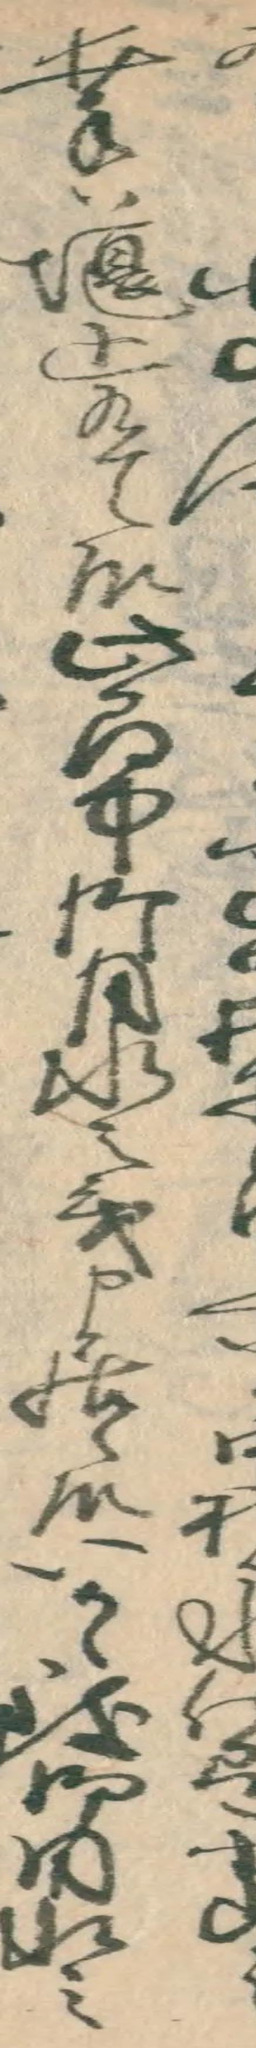井手ハ堰止有之候故此間中御用水之義申居候故いかゝ致御用水之
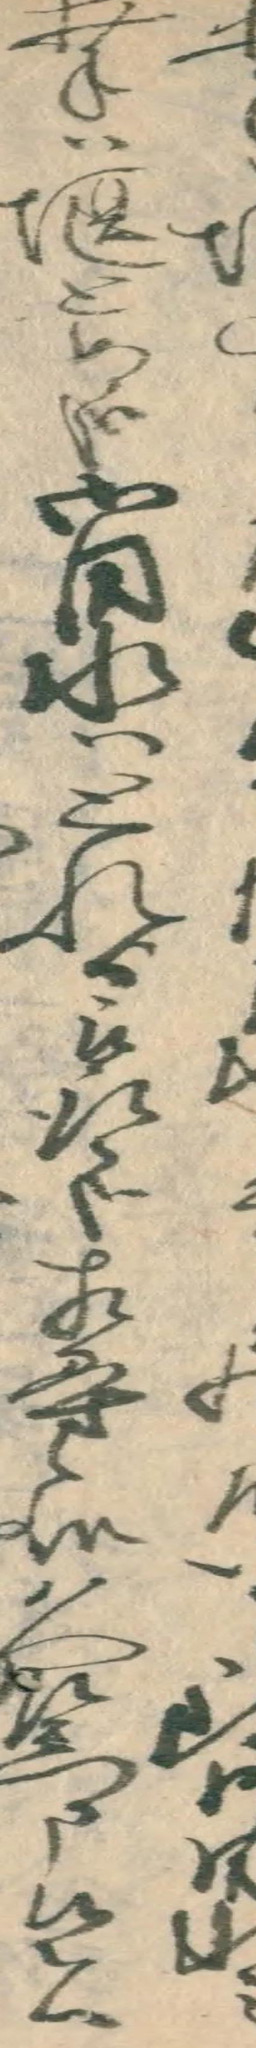井手ハ堰とめ候哉御用水ハとれゟ被取候哉相尋候処久左衛門申候は
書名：賀茂社記録. 第58冊
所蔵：国立国会図書館 National Diet Library, JAPAN
